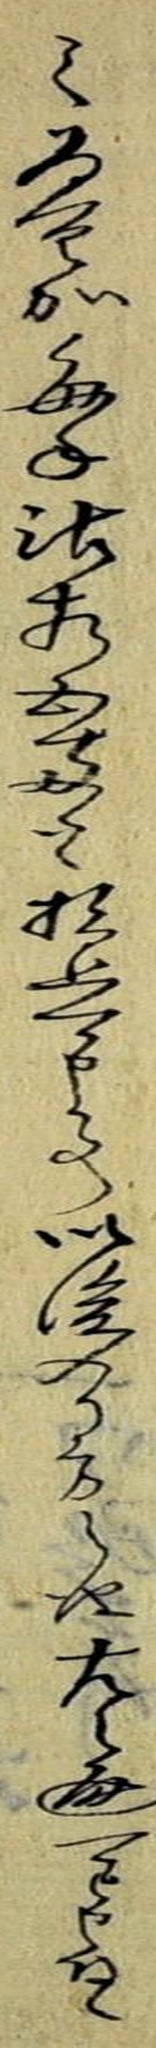之為冥加毎年銀拾五両つヽ指上可申事以後〆り方之儀左之通可被申付候
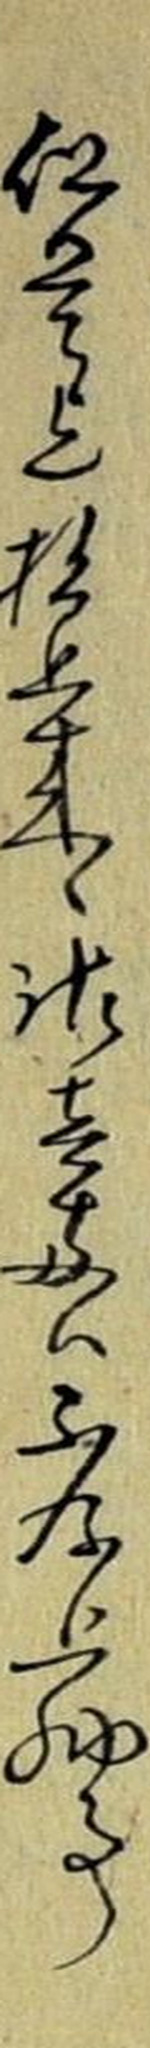但是迄指上来候銀壱両は不及上納事
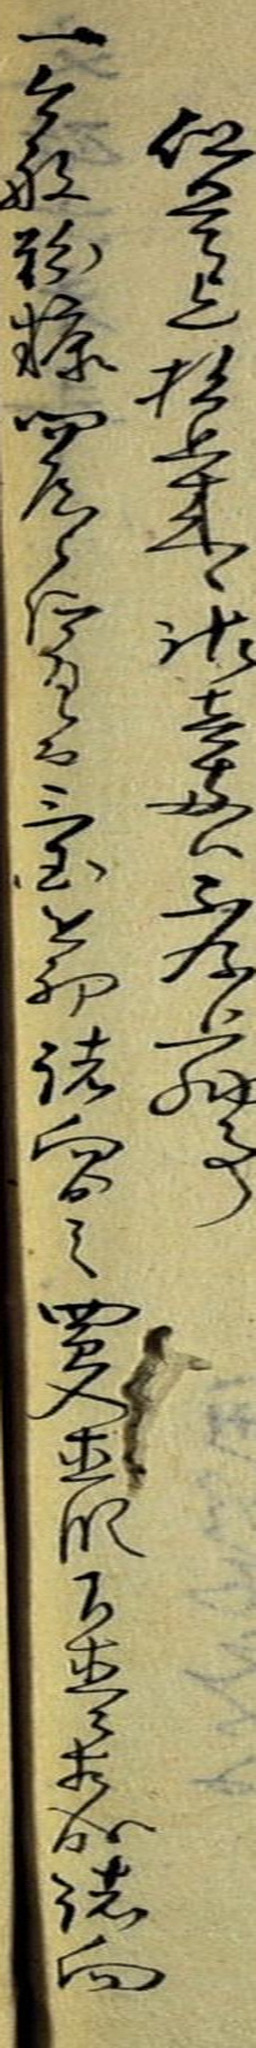一今般粉糠問屋被仰付候而三国を初諸向ゟ之買入直段下直に相成諸向
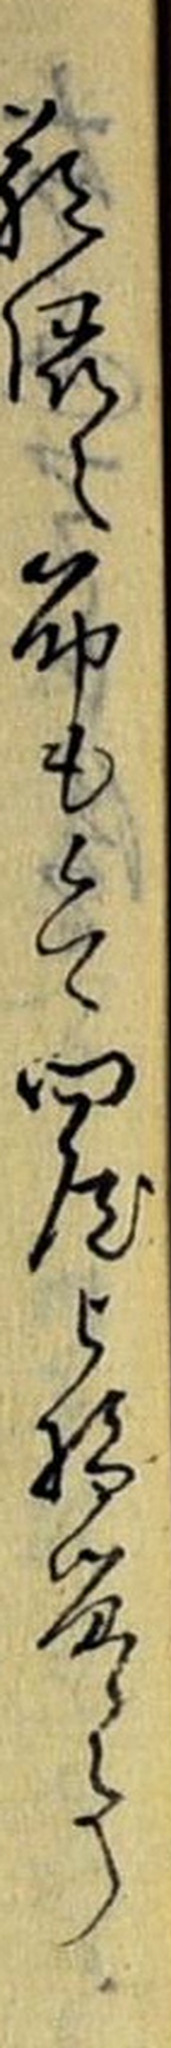難渋之筋も候はヽ問屋被指留候事
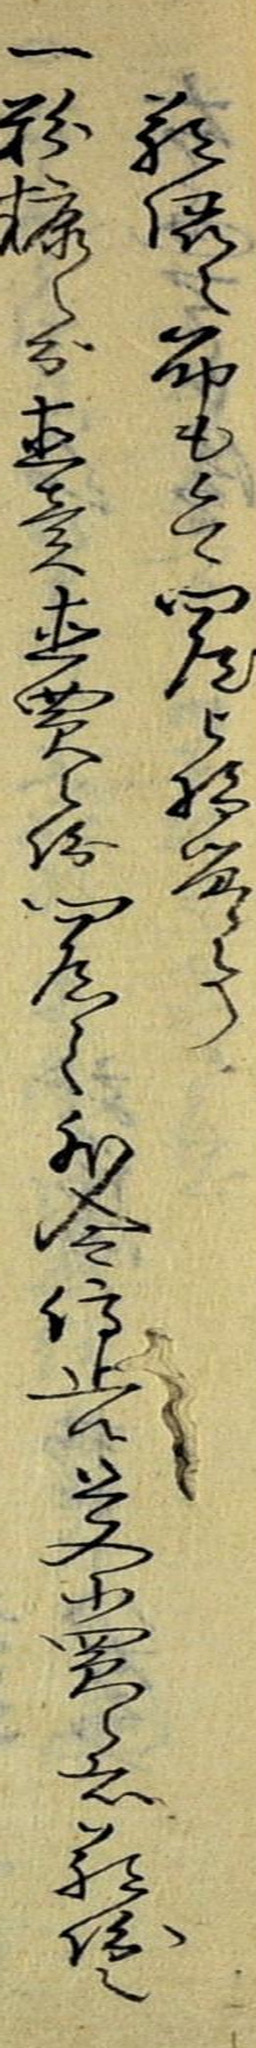一粉糠之分直売直買之儀問屋之外令停止候且又小売之者難儀之
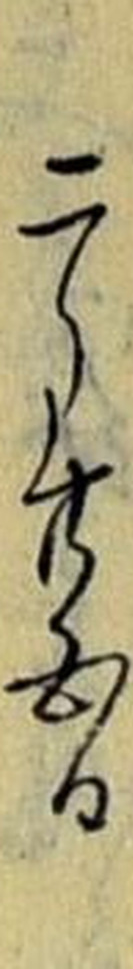二月廿五日
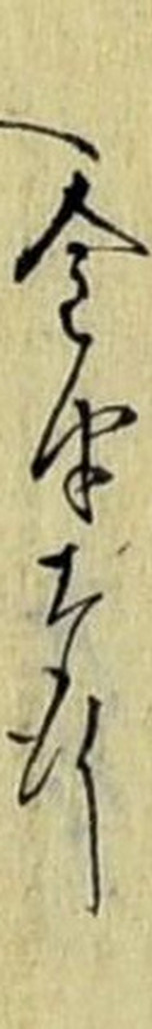金津奉行
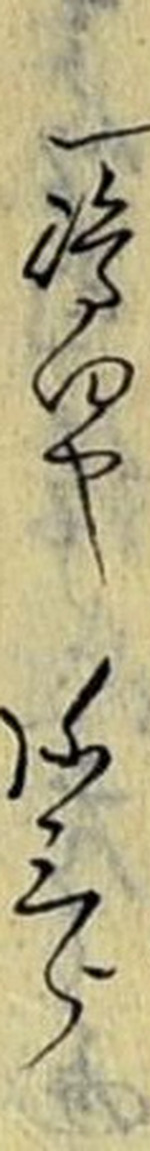嶋田や弥三郎
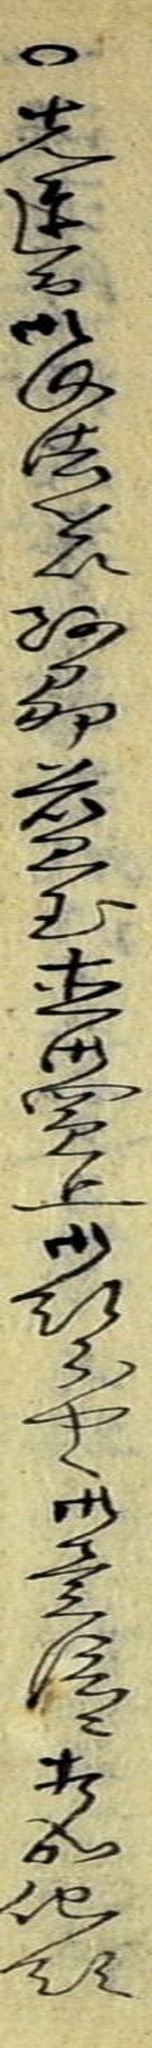○先達而御趣法を以阿州藍玉直御買上御領分中へ御売渡に相成他領
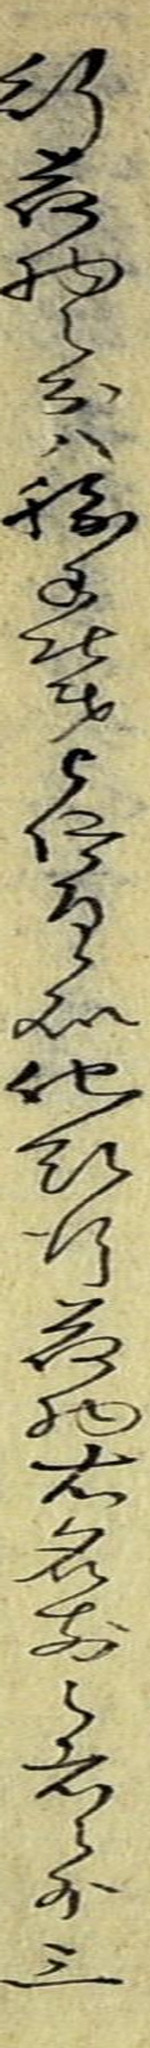行荷物之分は勝手次第被仰付候処他領行荷物右名前之者之外三
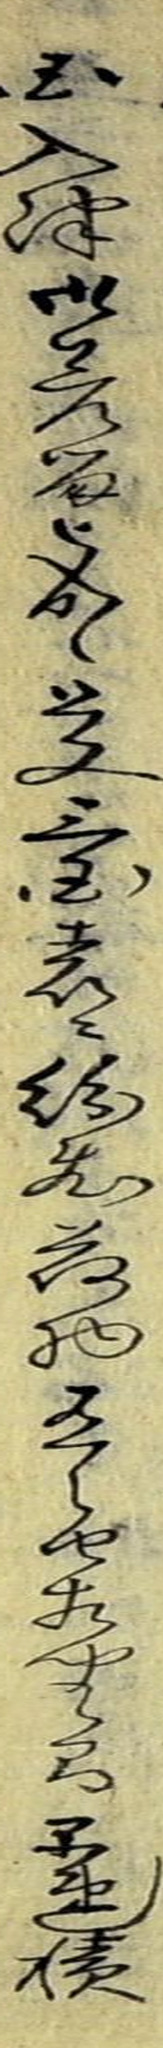国入津御差留被成候且又三国表に紛敷荷物有之由相聞候間早速積
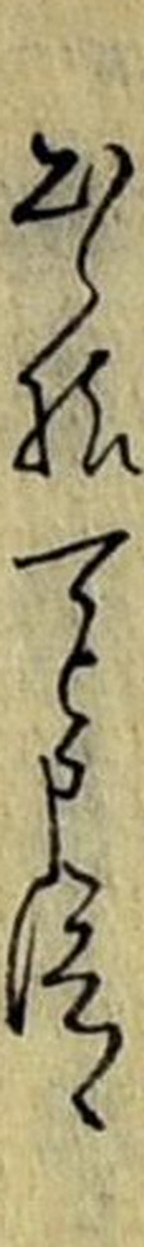出候様可被申渡候
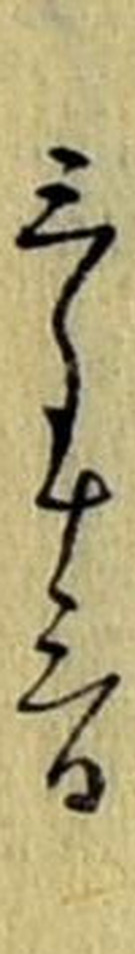三月十三日

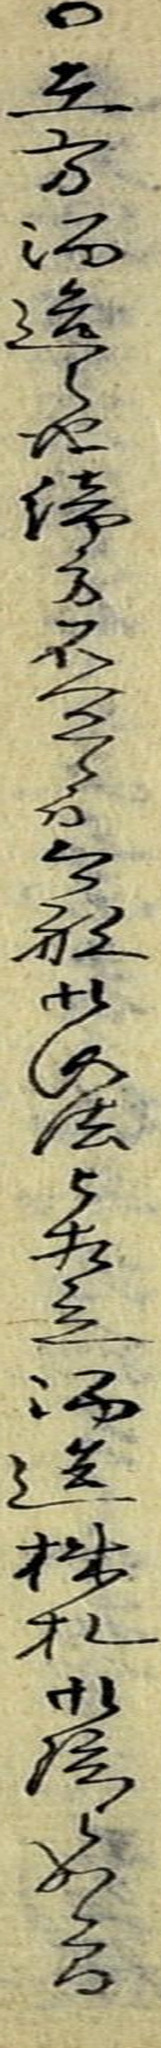○在方酒造之儀締方不宜候に付今般御趣法被相立酒造株札御渡被成候間
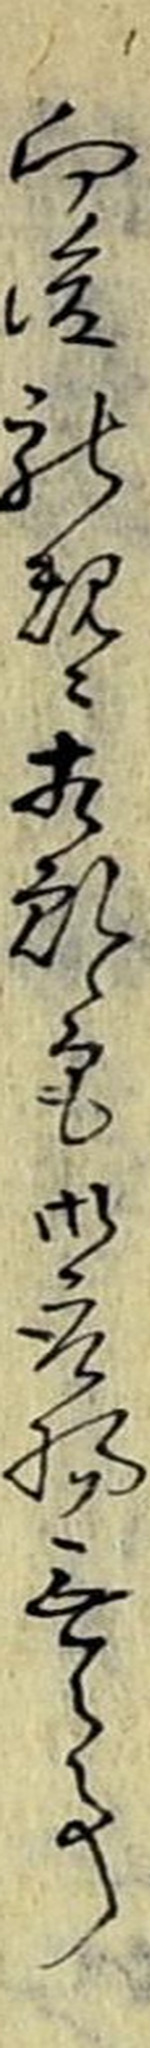向後新規に相願候而も御取揚無之事
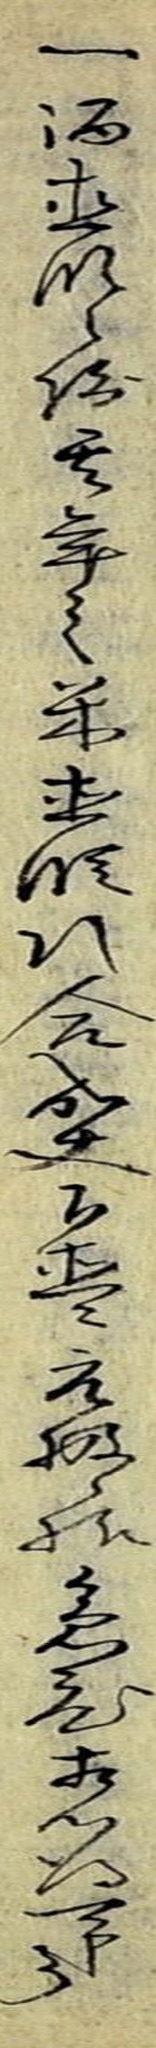一酒直段之儀其年之米直段引合成丈下直に取扱候様急度相心得可申事
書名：命令之部 四
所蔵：福井県文書館 Fukui Prefectural Archives
